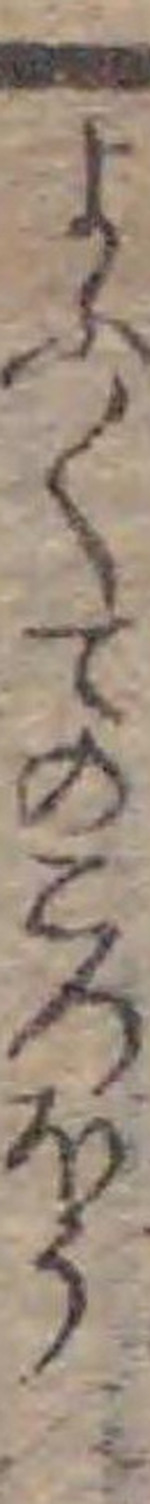よふ〳〵てのこつほう
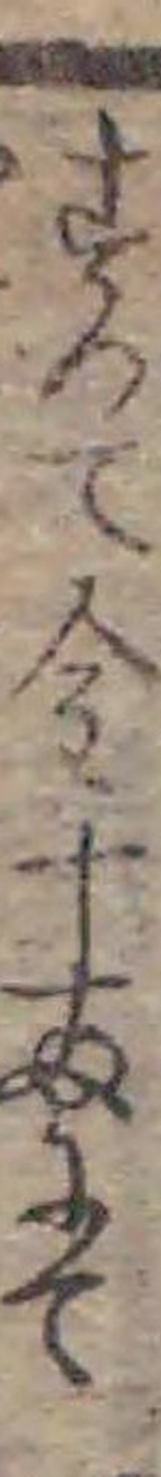すつて金十両にて
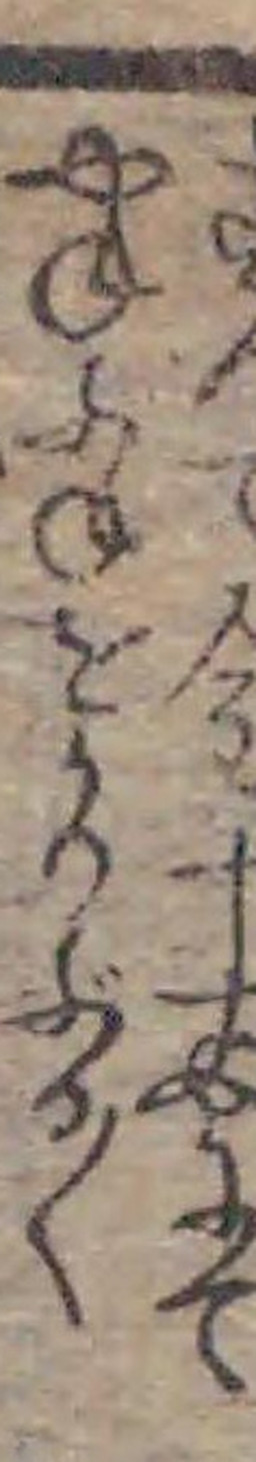やねふねをうかぶる〳〵
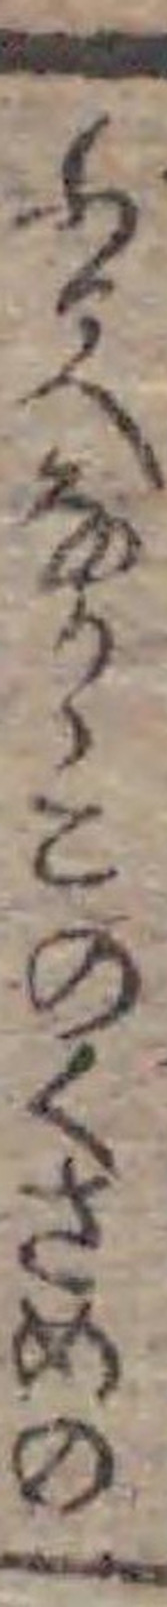ふるへなからこのくさめの
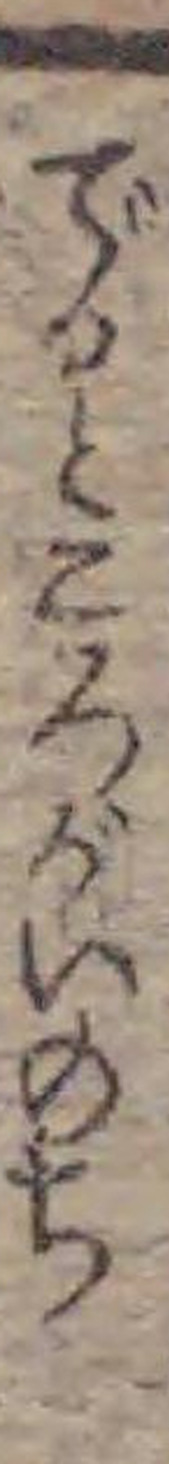でるところがいのち
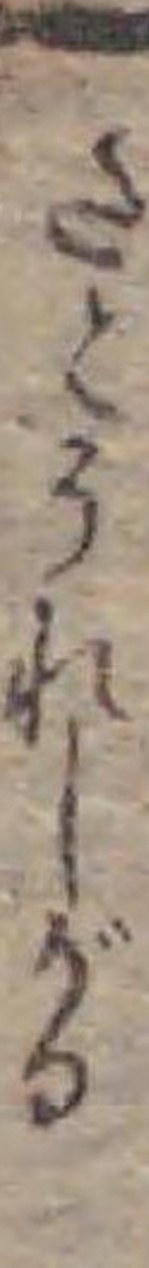だとうれしがる
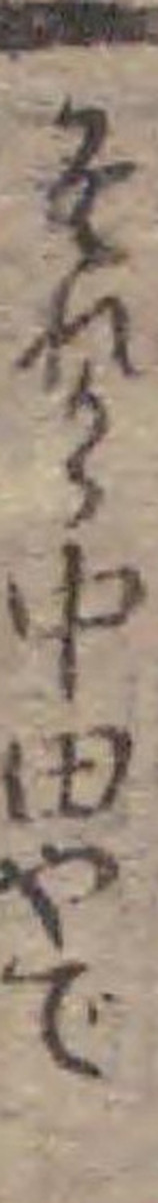それから中田やで
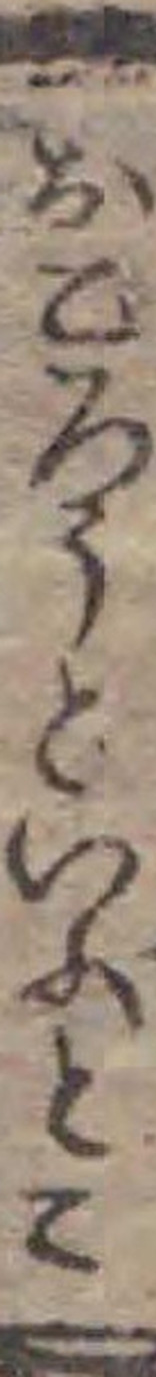おころうといふとこ
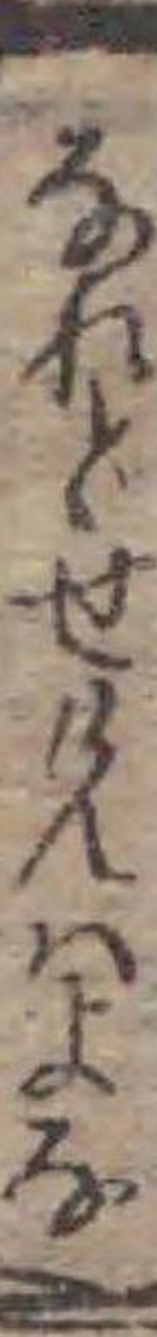なれどせけんはよな
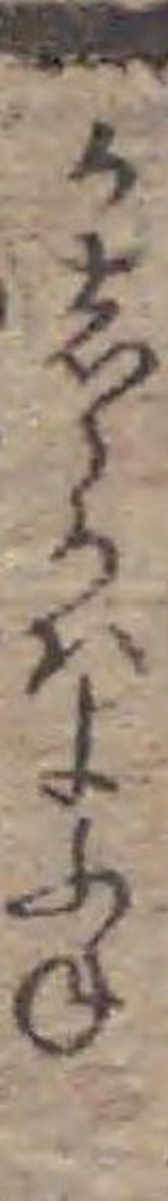かしらかはよふね
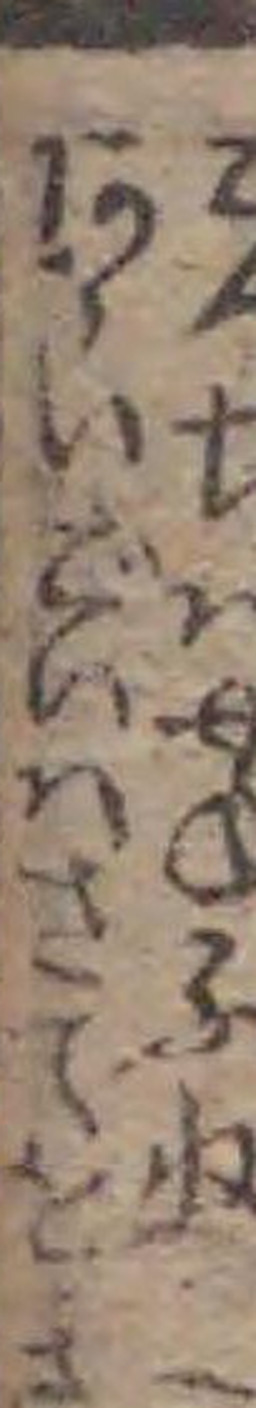あらいごいはさでをき
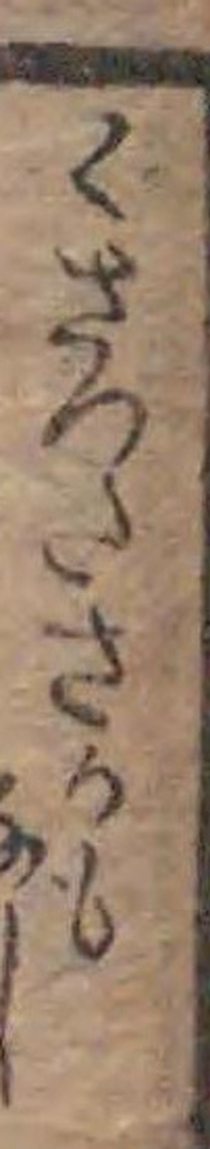くさつたさかも
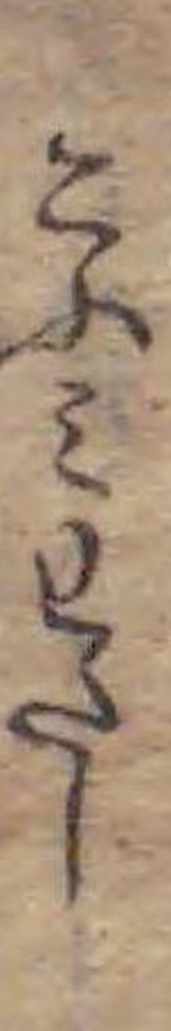こふみわたし
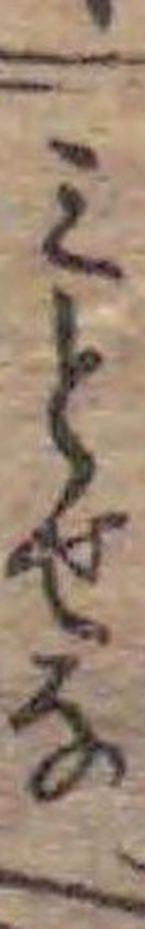みとせな
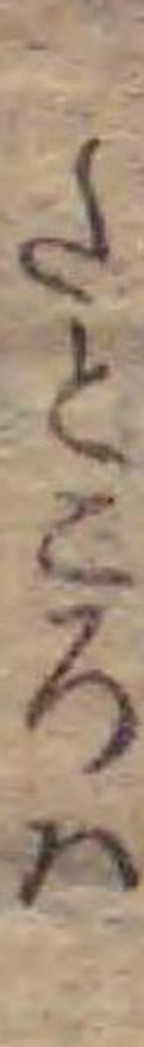たところは
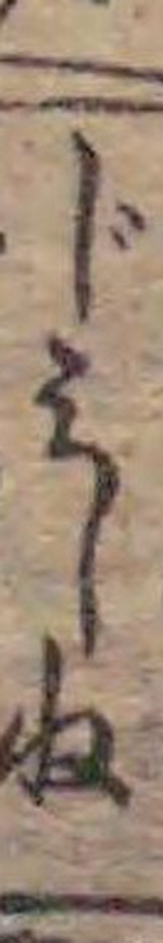じみしね
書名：化物楽屋異牒 : 2巻
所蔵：国立国会図書館 National Diet Library, JAPAN
